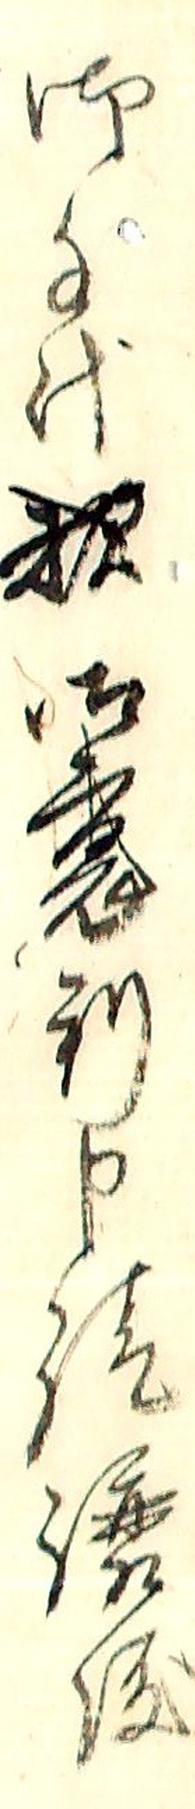御手代御裏判申請譲渡
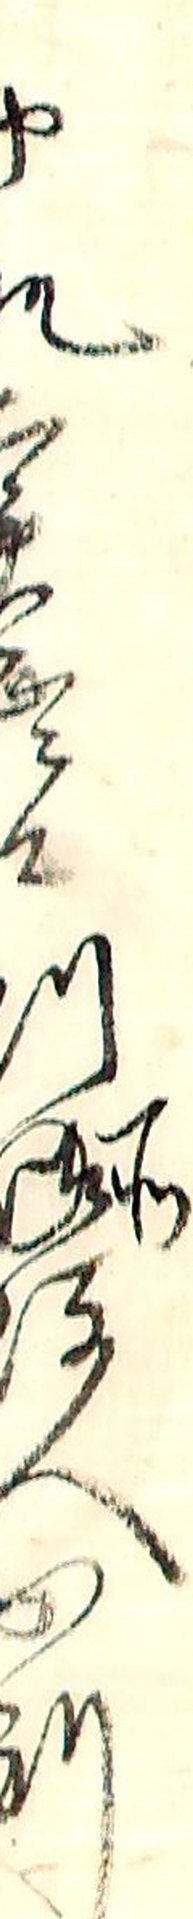申処実正に候則所役人加判

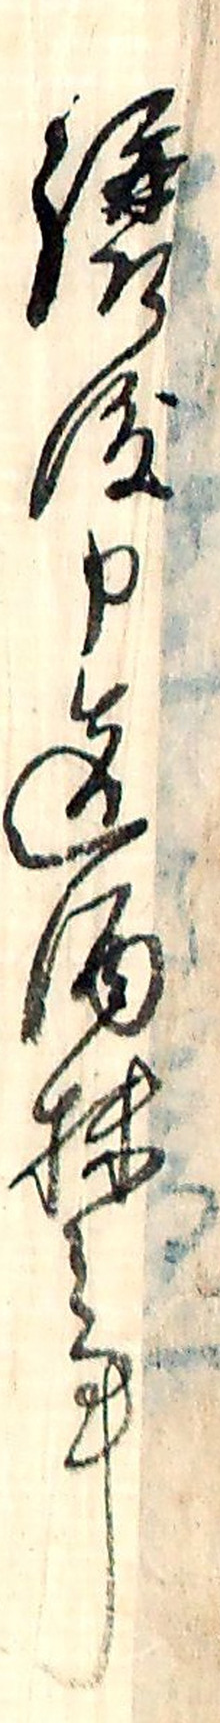譲渡申造酒株之事
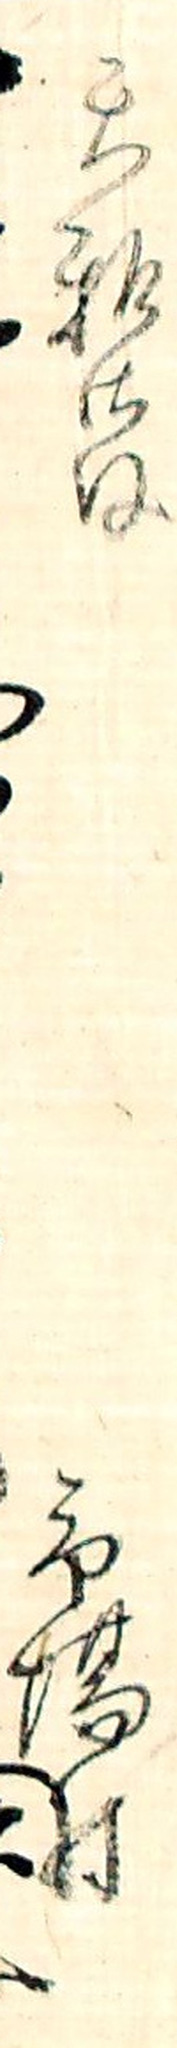天和御改市場村
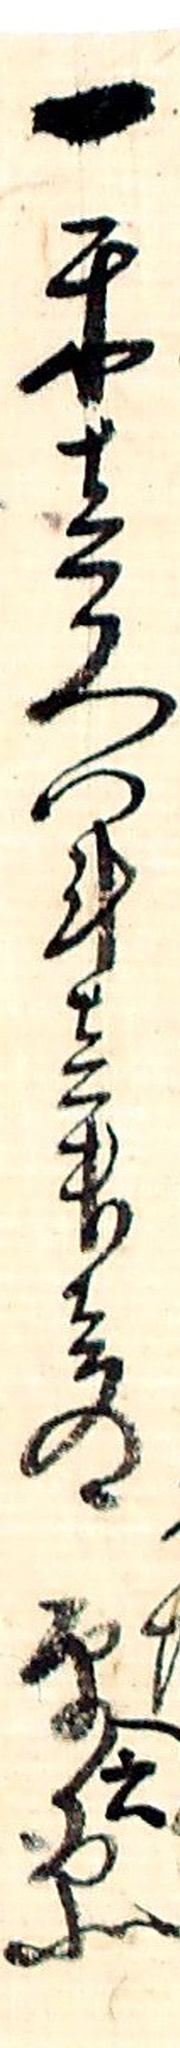一米壱石八斗壱升壱合平六兵衛
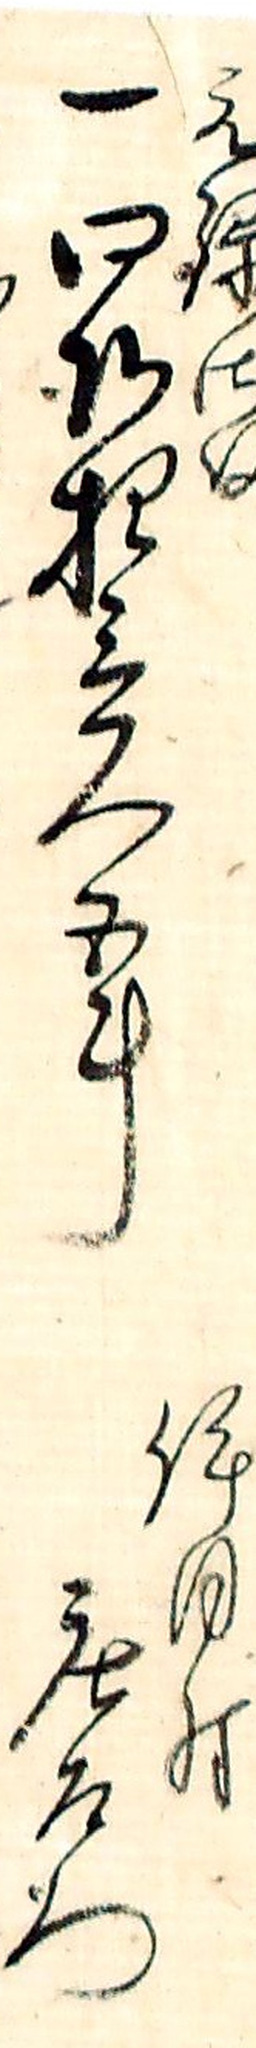一同弐拾三石五斗庄左衛門
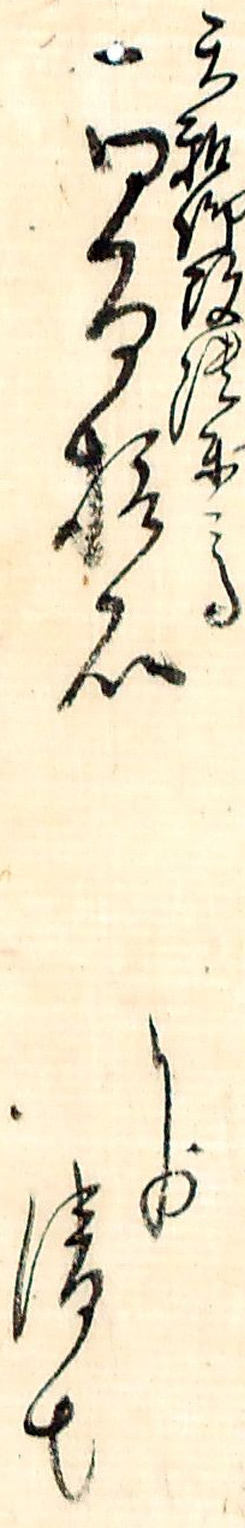一同百拾石清七
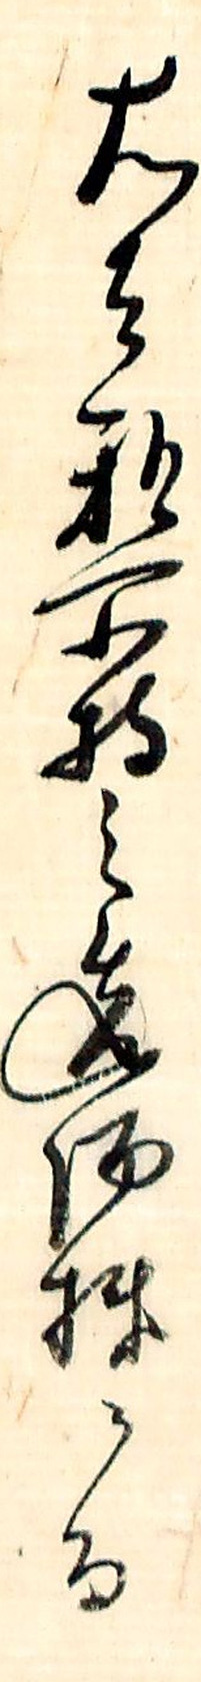右は私所持之造酒株にて
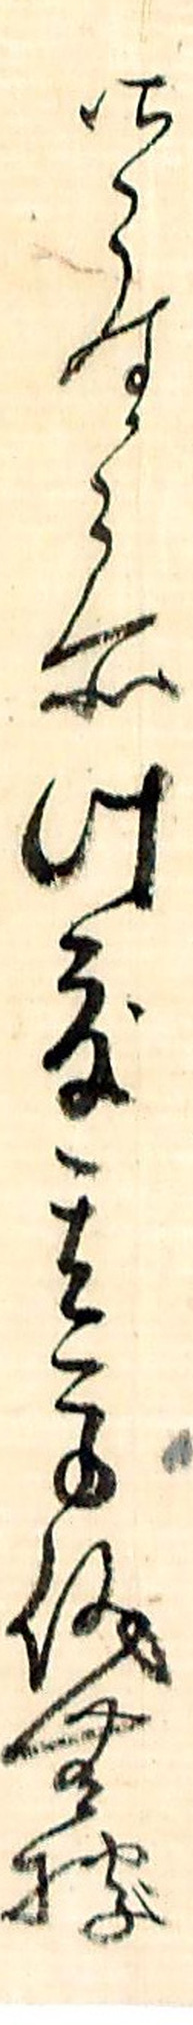御座候所此度其方儀無拠
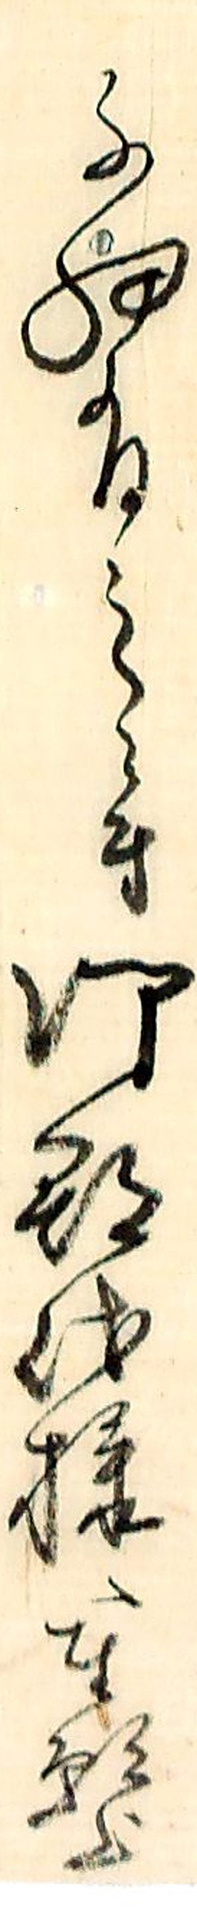子細有之に付御郡代様へ奉願上
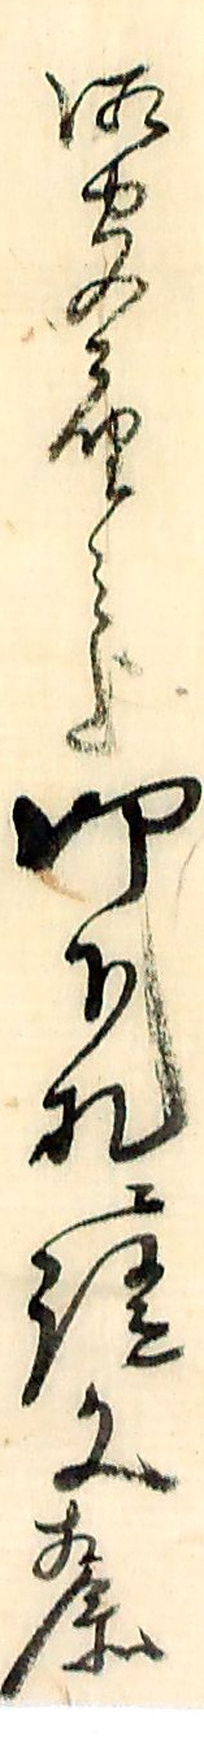御聞届之上御下札に証文相添
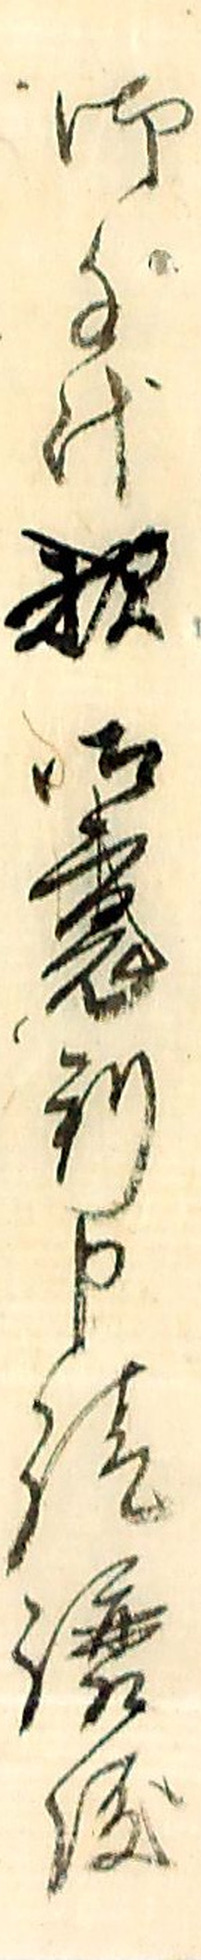御手代様御裏判申請譲渡
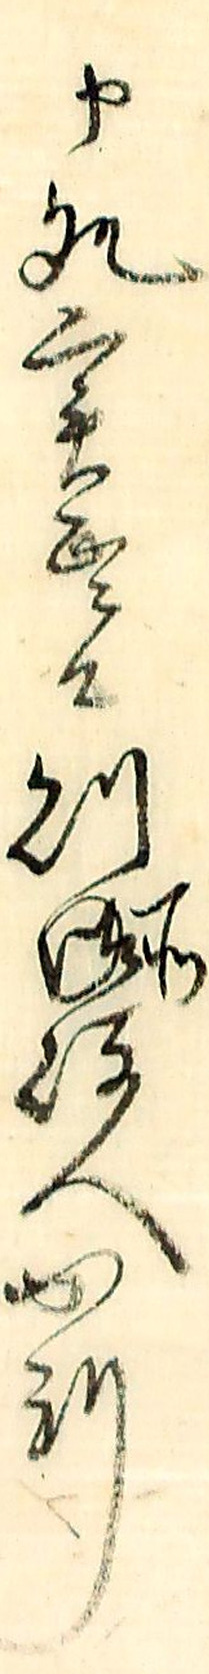申処実正に候則所役人加判
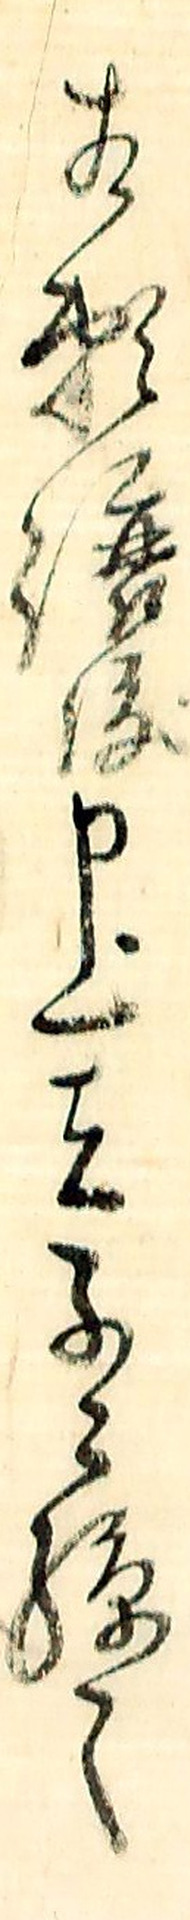相願譲渡申上尤子々孫々
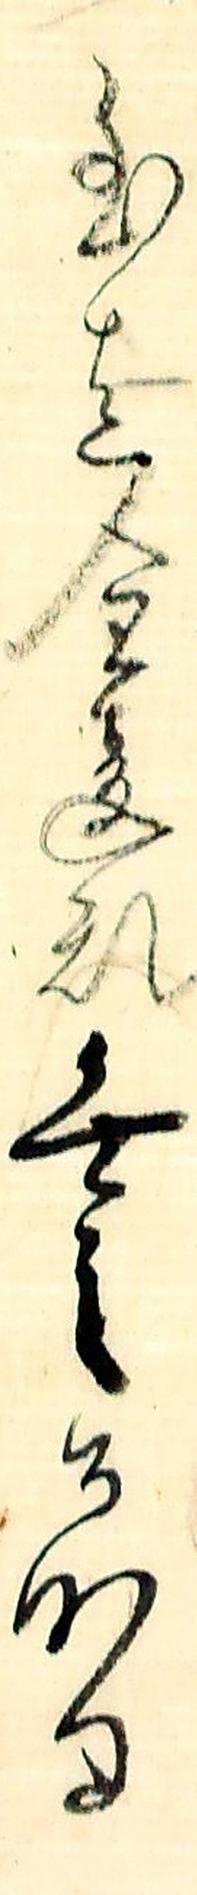至迄全違乱無之候仍て
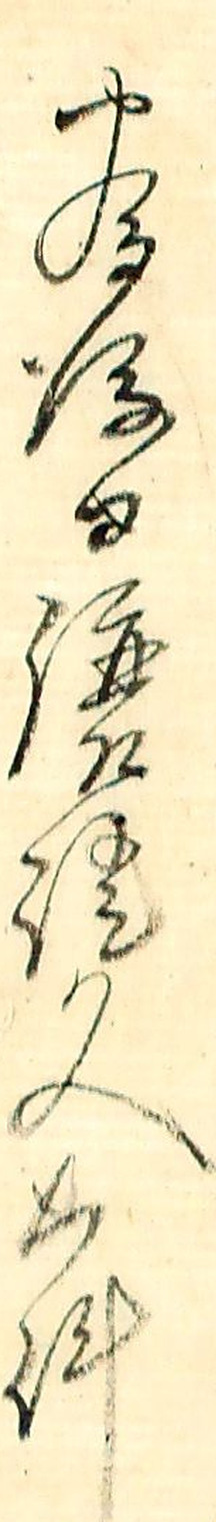為後日譲証文如件
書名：諸御願書控(後藤氏壱番）
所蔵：鳴門教育大学 Naruto University of Education
